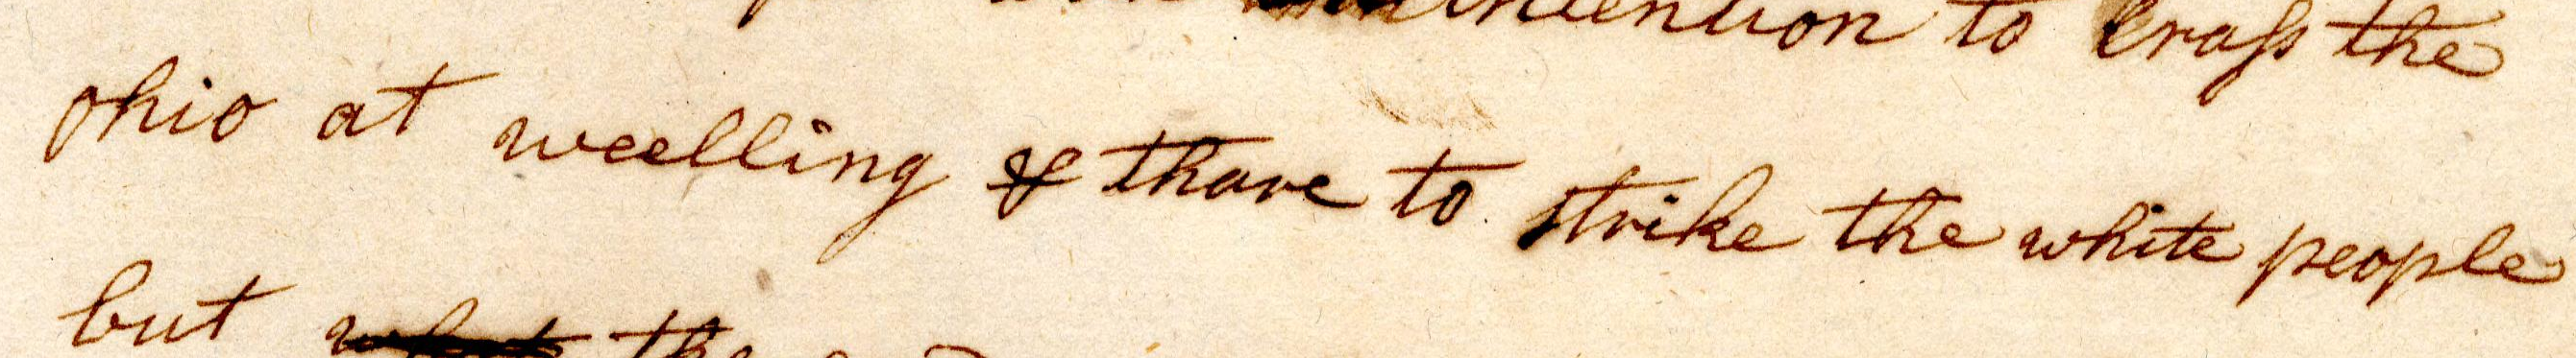Ohio at weelling & thare to strike the white people
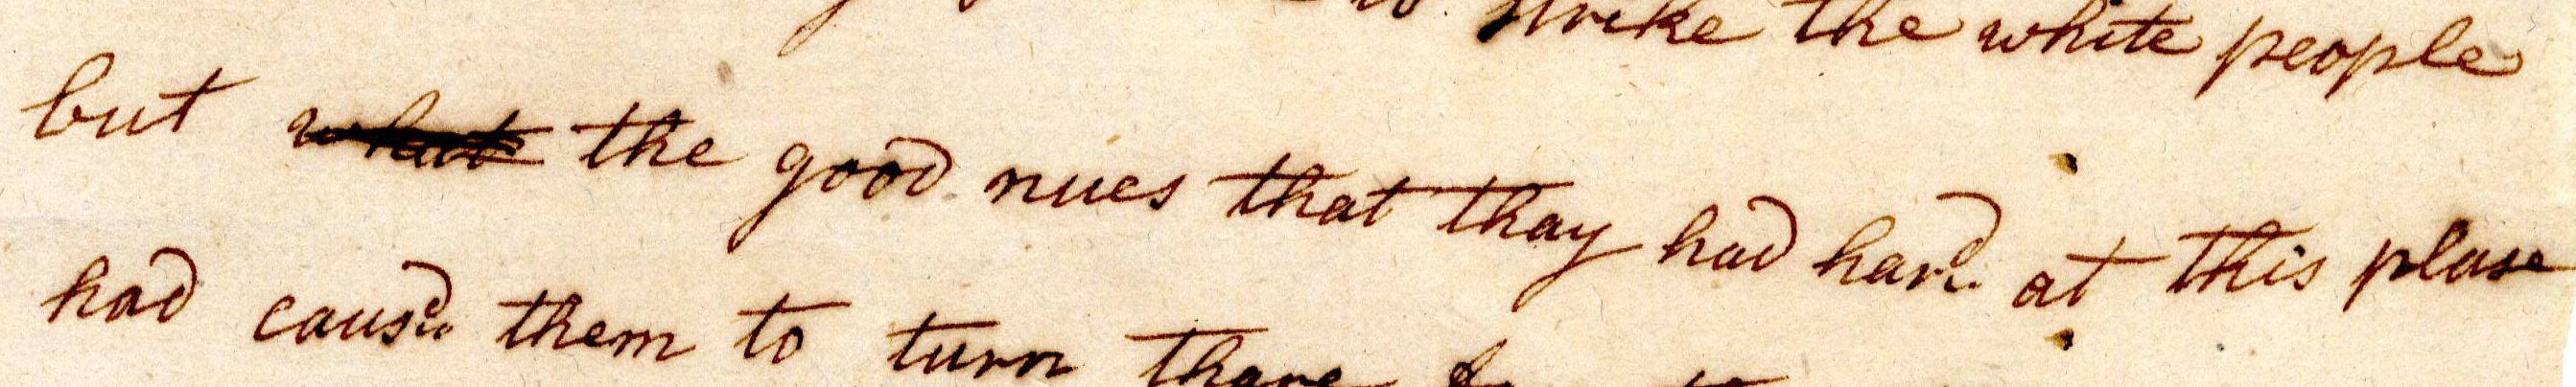but what the good nues that thay had har^d at this plase
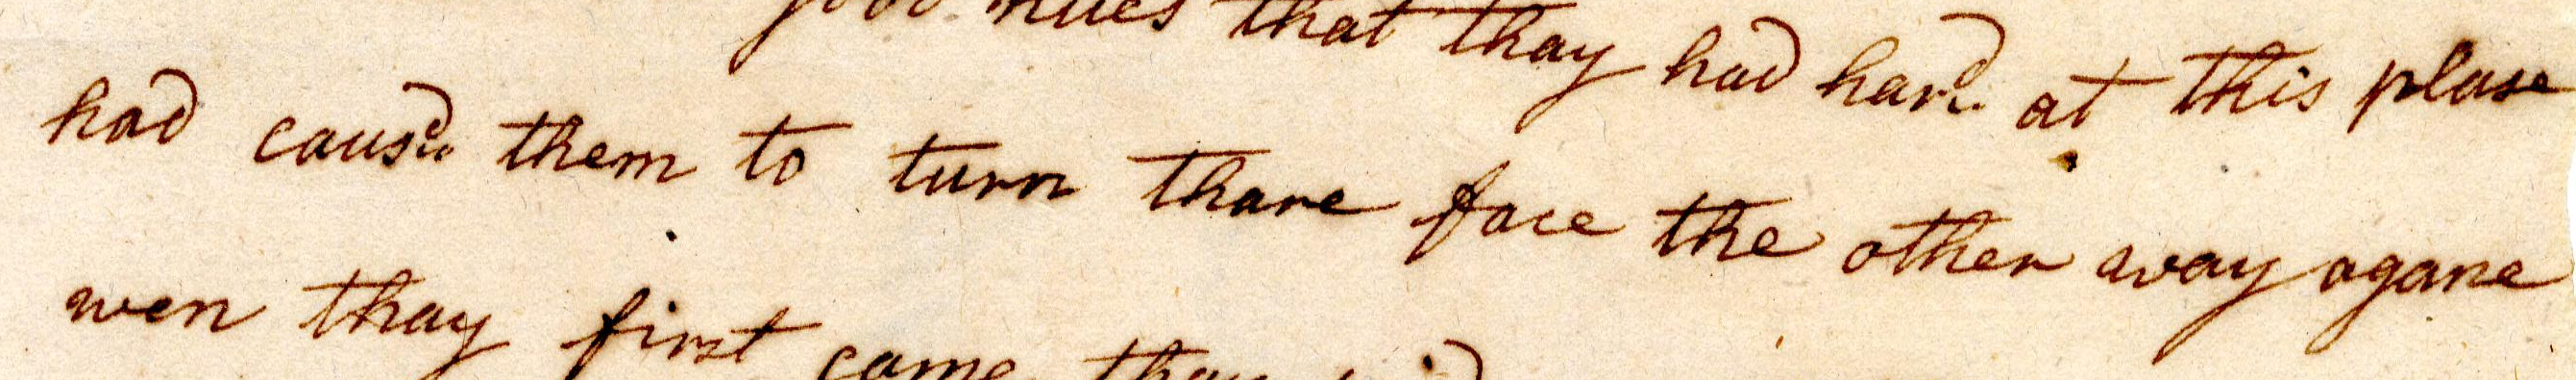had caus^d them to turn thare face the other way agane
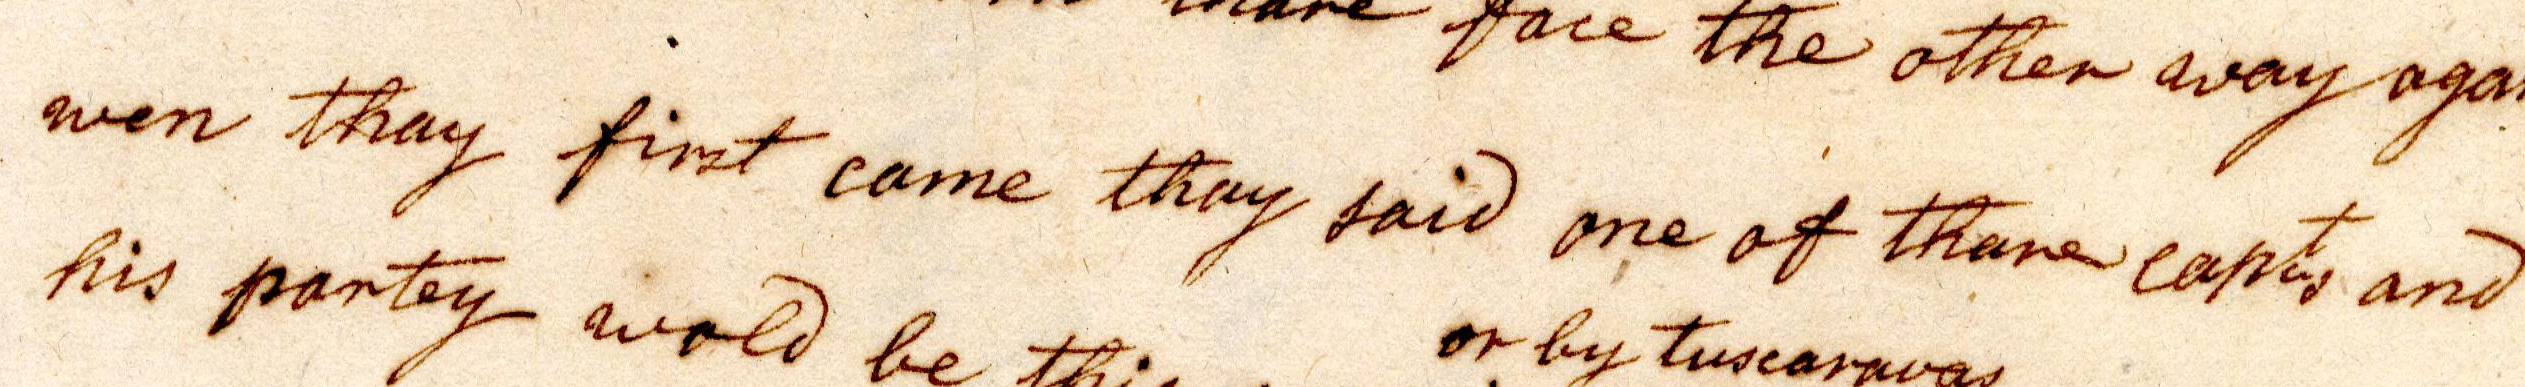wen thay first came thay said one of thare cap^ts and
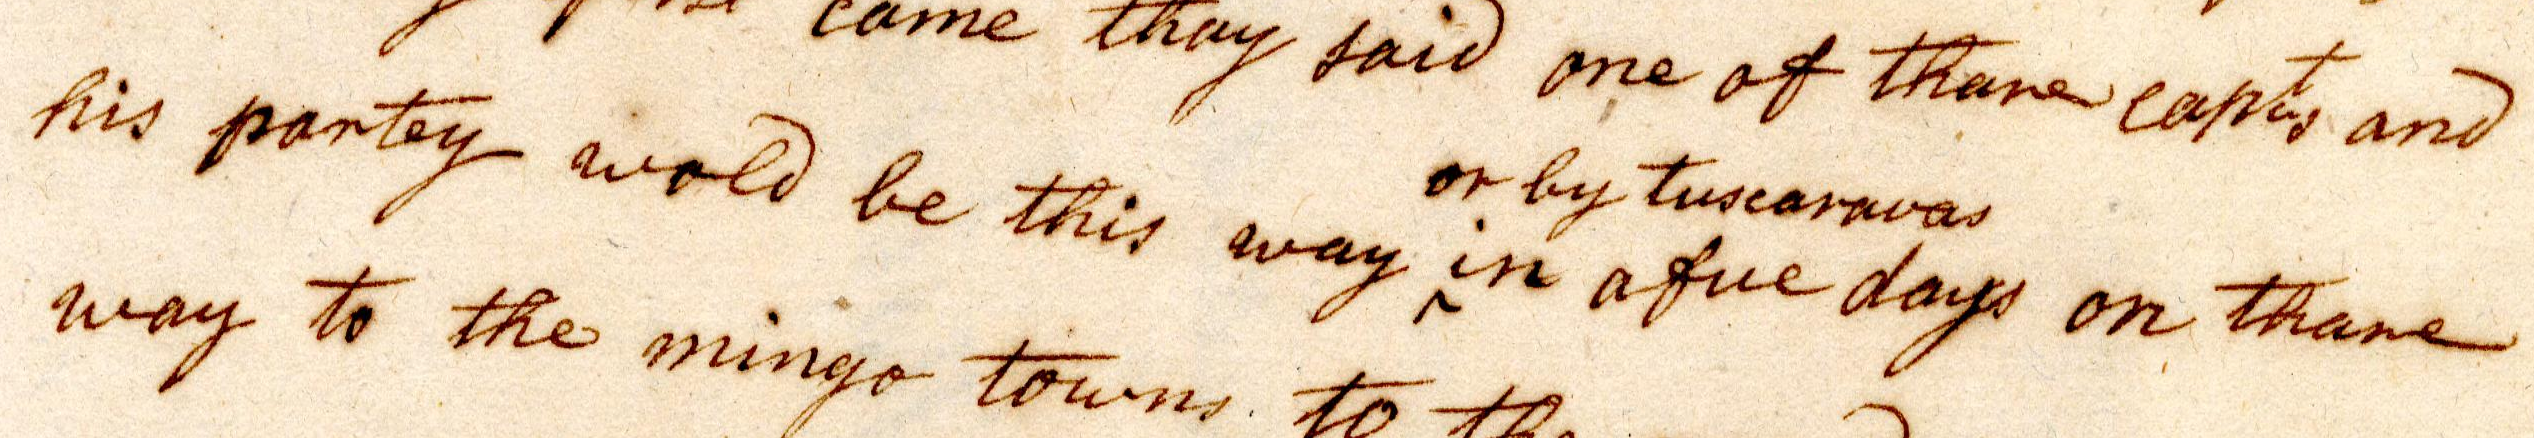his partey wold be this way ^ in a fue days on thare
